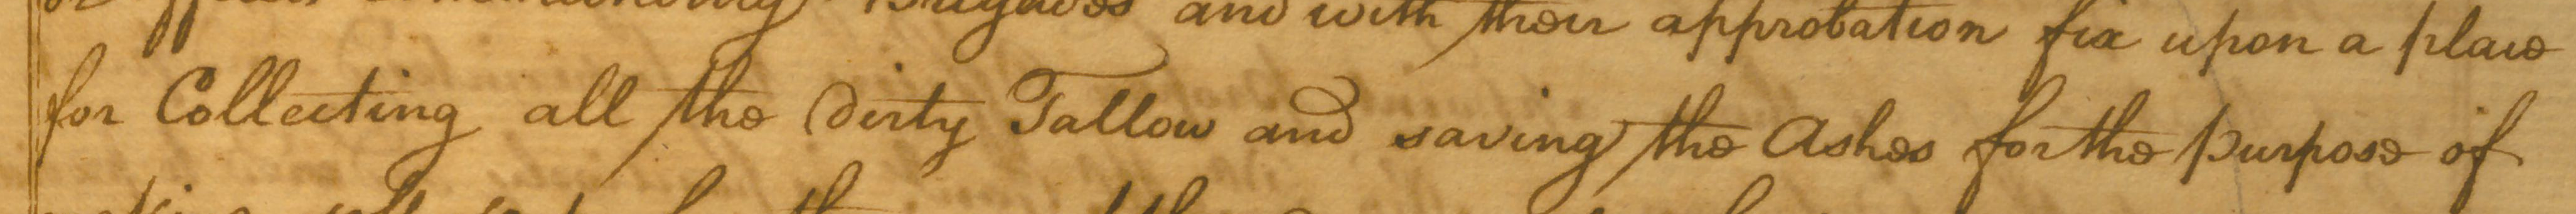for Collecting all the dirty Tallow and saving the Ashes for the purpose of
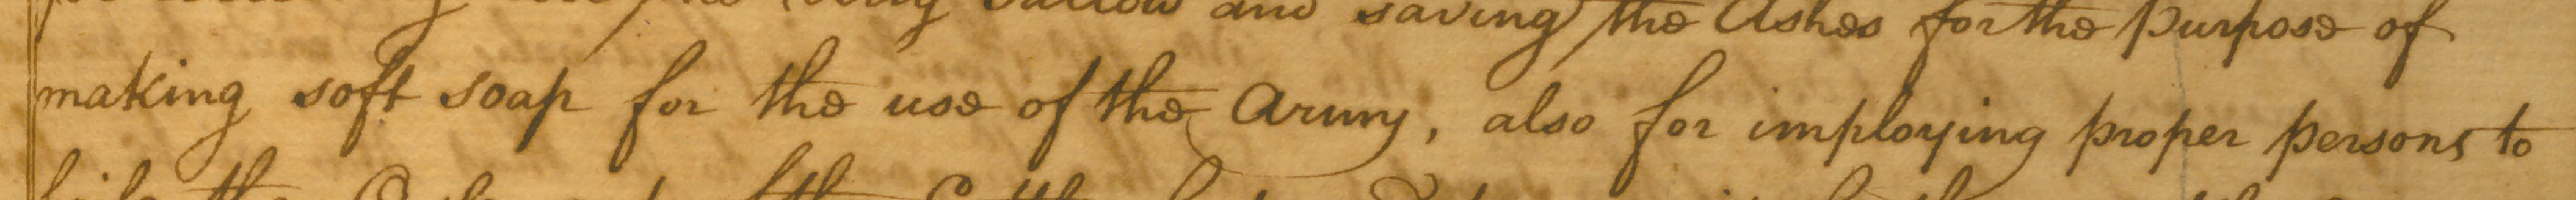making soft soap for the use of the Army, also for imploying proper persons to
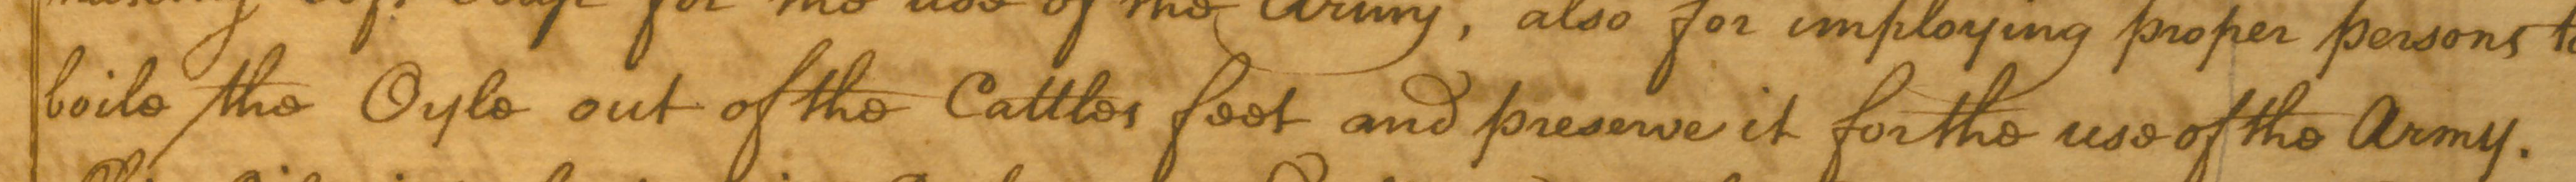boile the Oyle out of the Cattles feet and preserve it for the use of the Army.
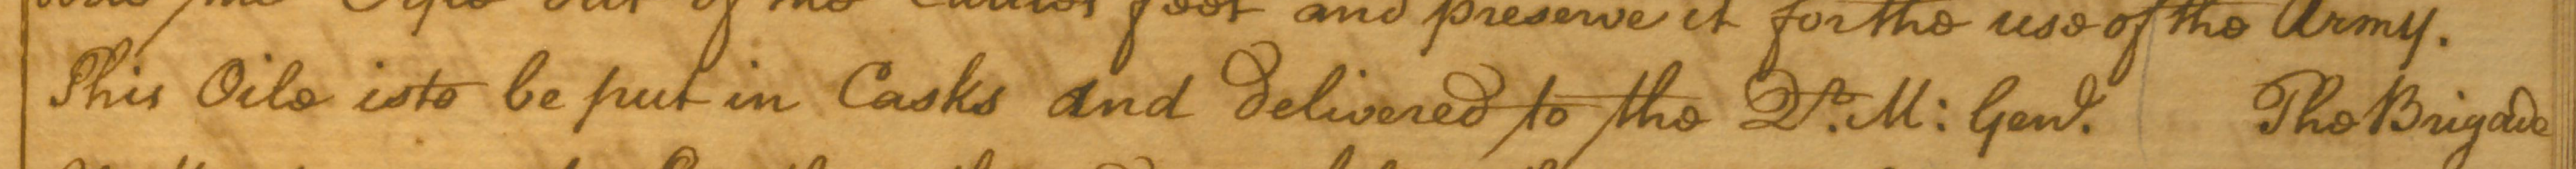This Oile is to be put in Casks and delivered to the Q^r. M: Gen^l. The Brigade
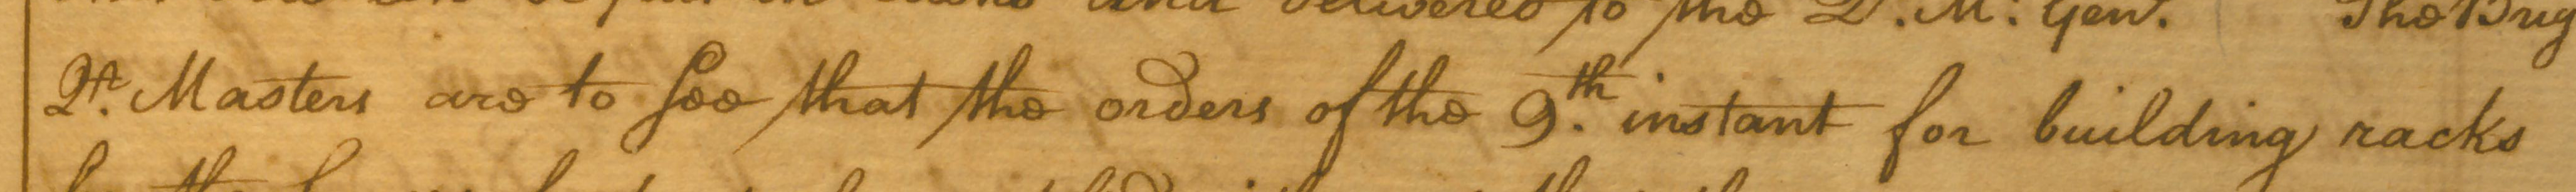Q^r. Masters are to see that the orders of the 9^th. instant for building racks
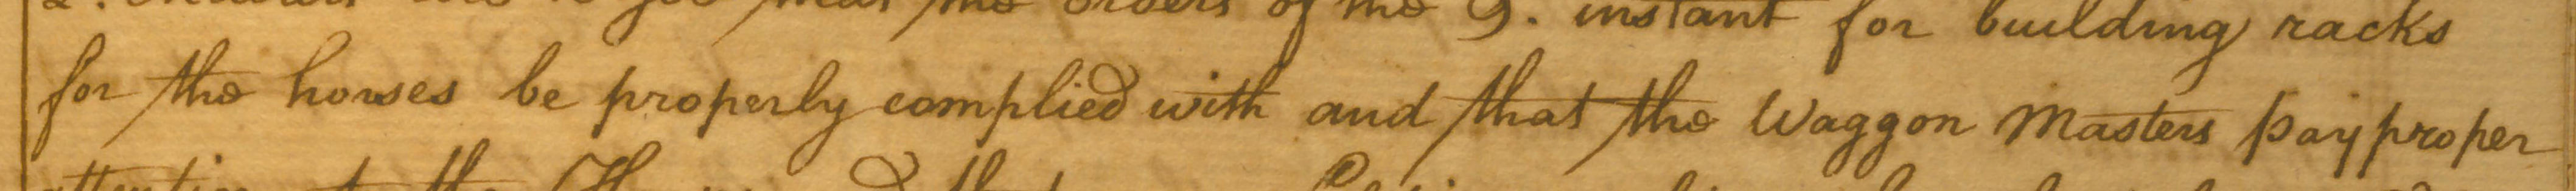for the horses be properly complied with and that the Waggon Masters pay proper
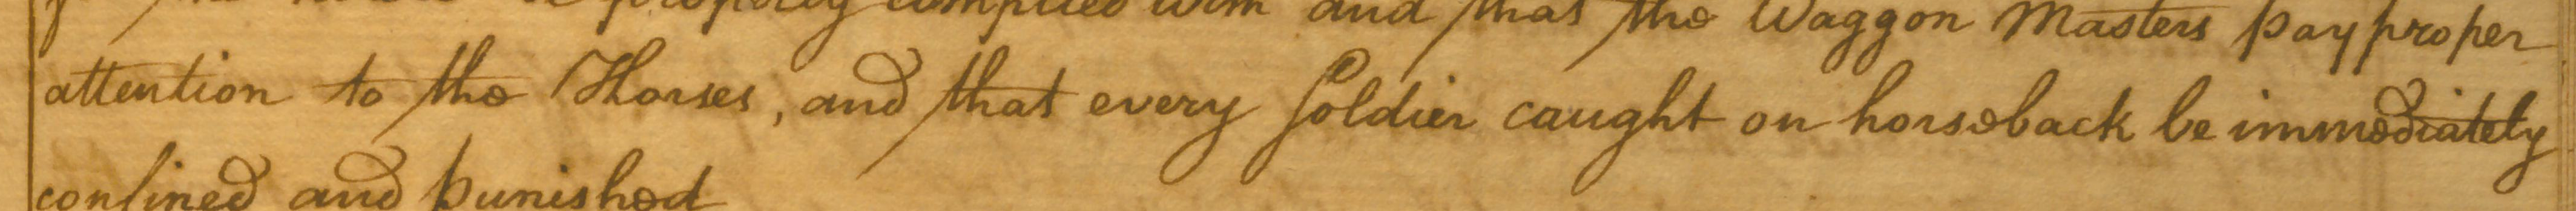attention to the Horses, and that every Soldier caught on horseback be immediately
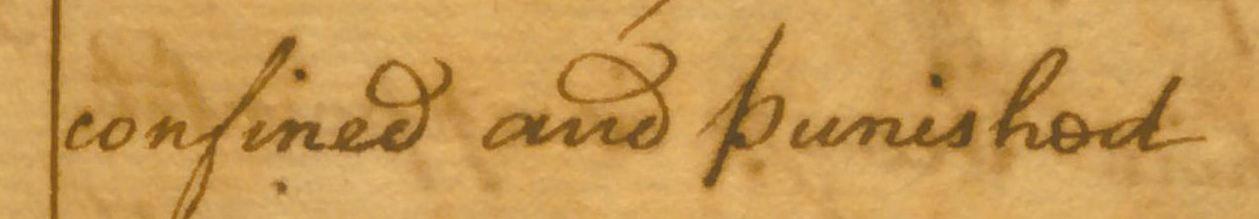confined and punished
